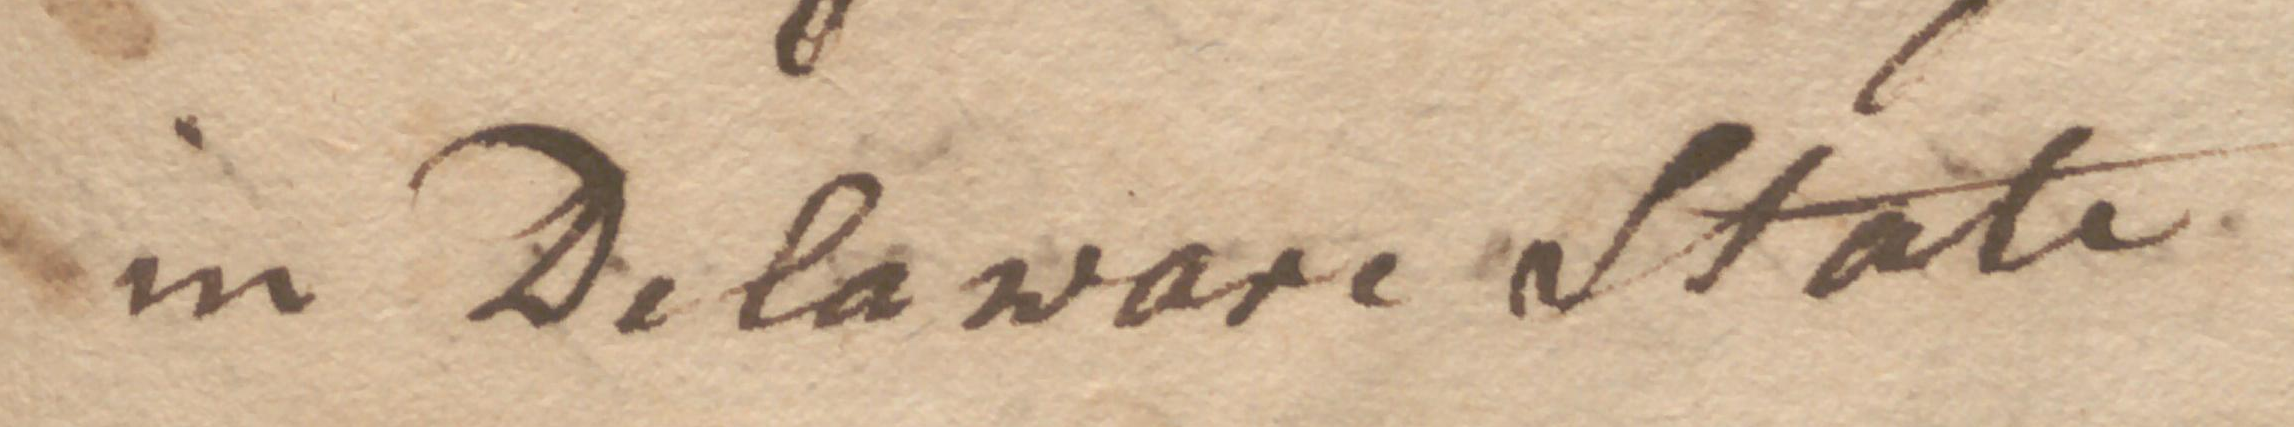in Delaware State
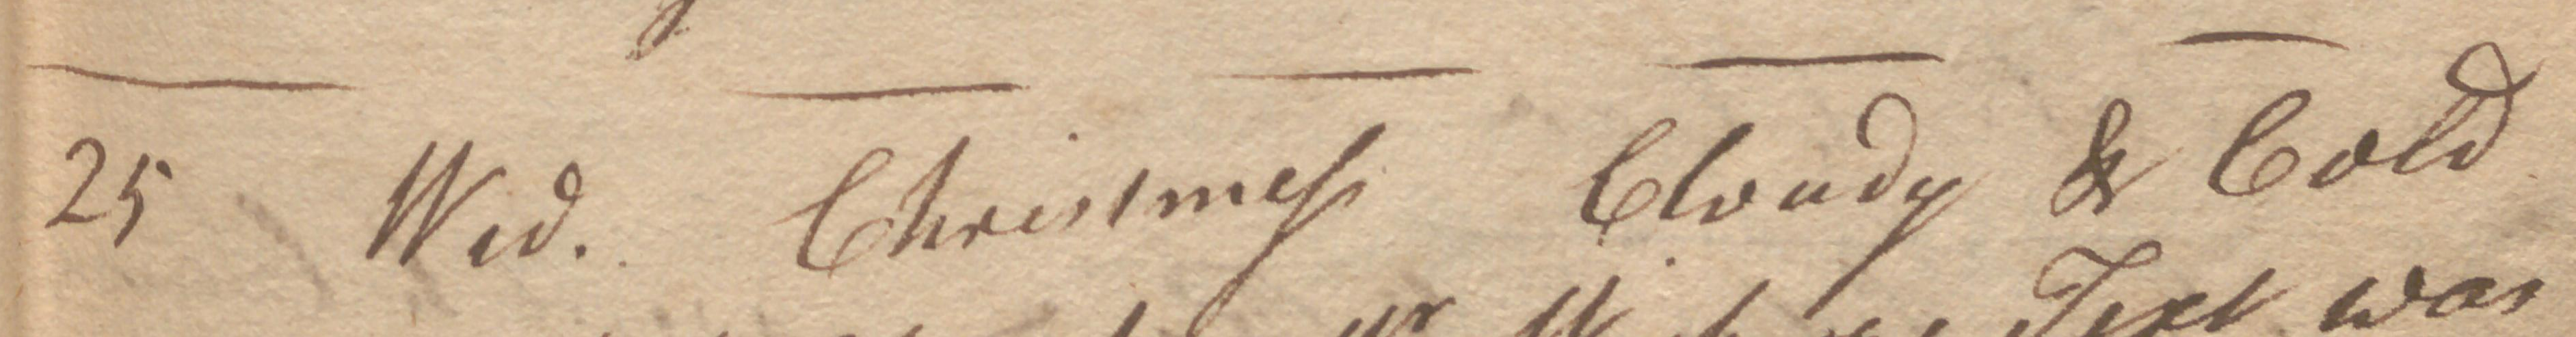25 Wed. Christmess Cloudy & Cold
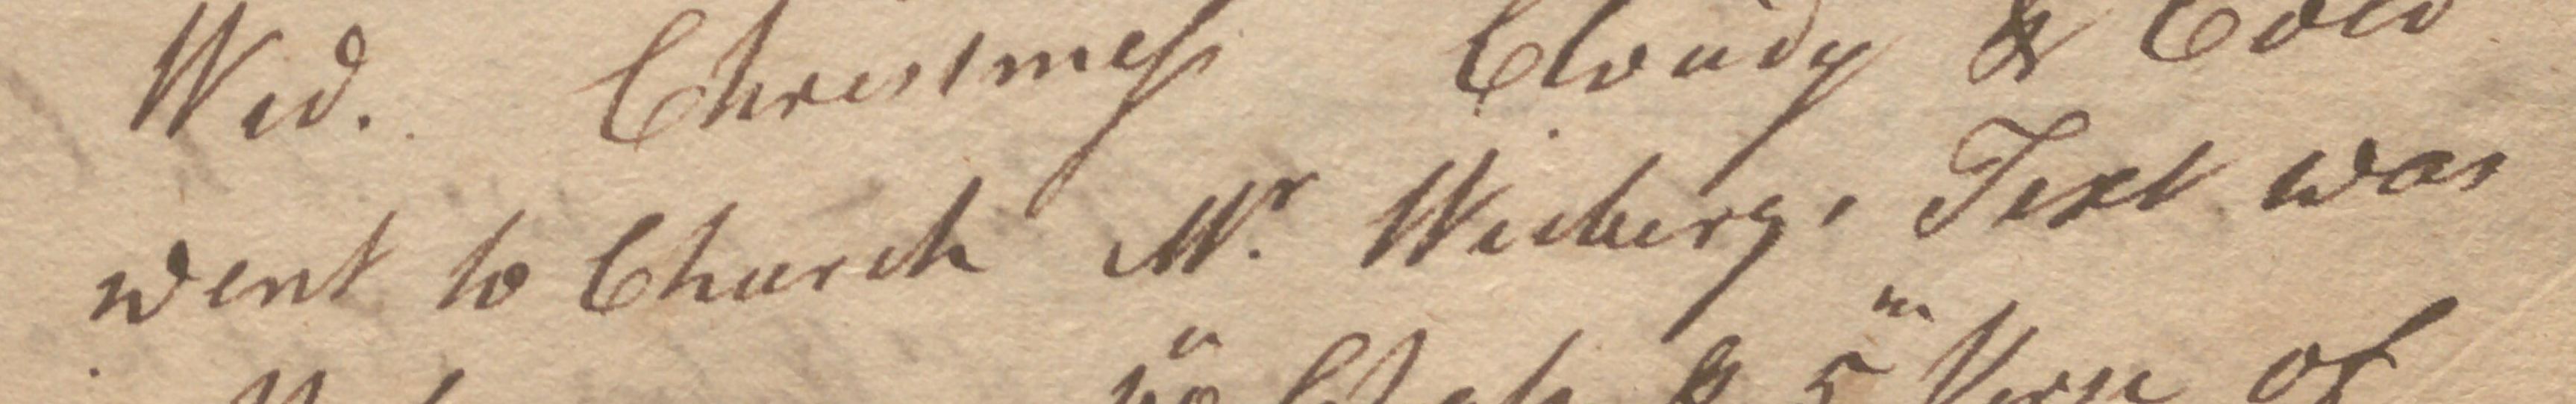went to Church M^r. Weiberg. Text was
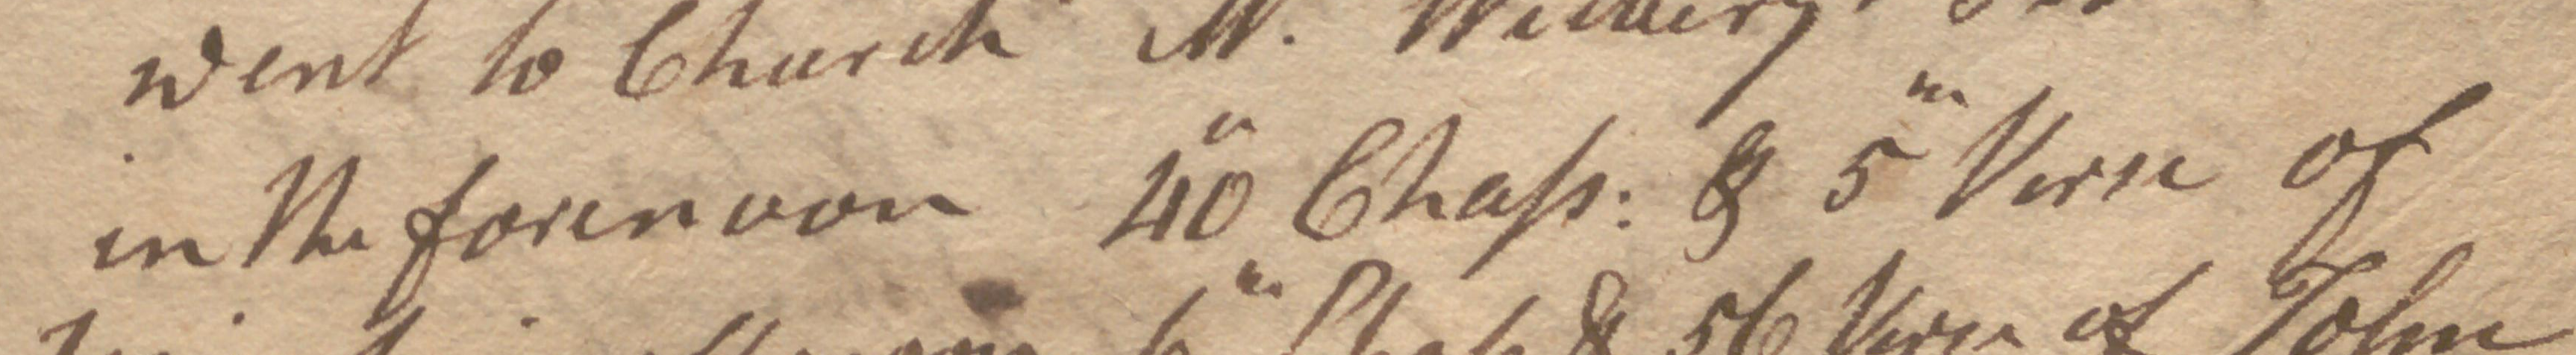in the forenoon 40^h Chaps: & 5^th Verse of
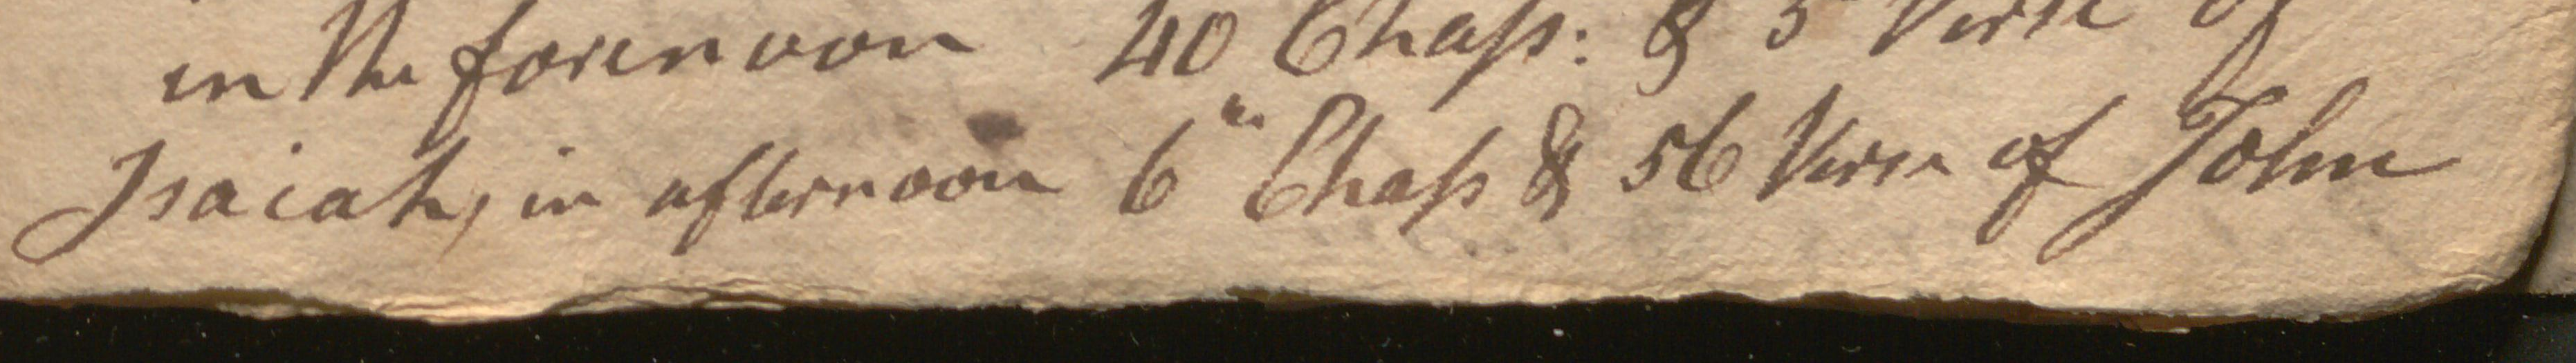Isaiah, in afernoon 6^th Chaps 56 Verse of John
